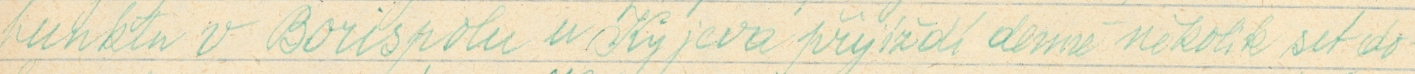punktu v Borispolu u Kyjeva přijíždí denně několik set do-
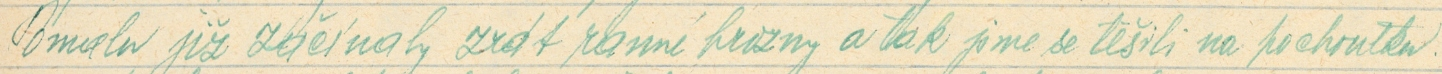Pomalu již začínaly zrát ranné hrozny a tak jsme se těšili na pochoutku.
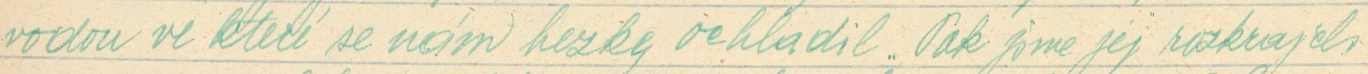vodou ve které se nám hezky ochladil. Pak jsme jej rozkrajeli
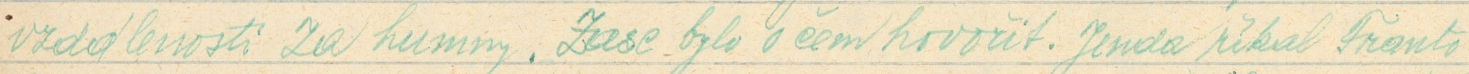vzdálenosti za humny. Zase bylo o čem hovořit. Jenda říkal Franto
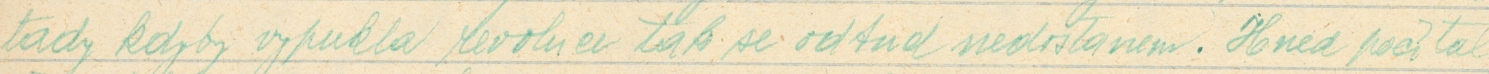tady kdyby vypukla revoluce tak se odtud nedostanem. Hned počítal
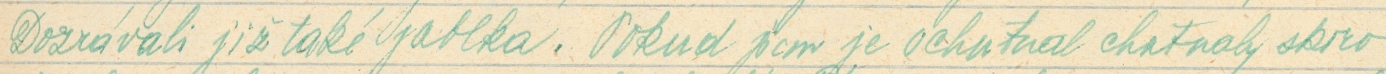Dozrávali již také jablka. Pokud jsem je ochutnal chutnaly skoro
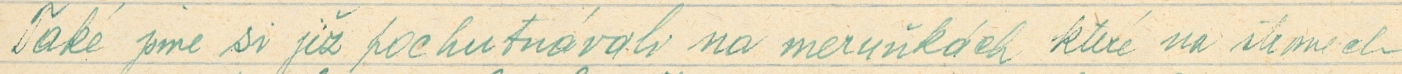Také jsme si již pochutnávali na meruňkách které na stromech
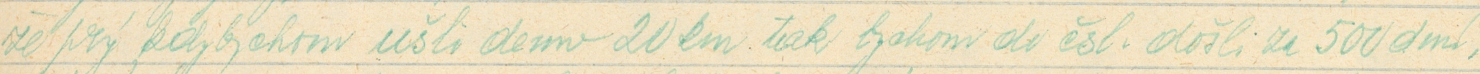že prý kdybychom ušli denně 20 km tak bychom do čsl. došli za 500 dní.
